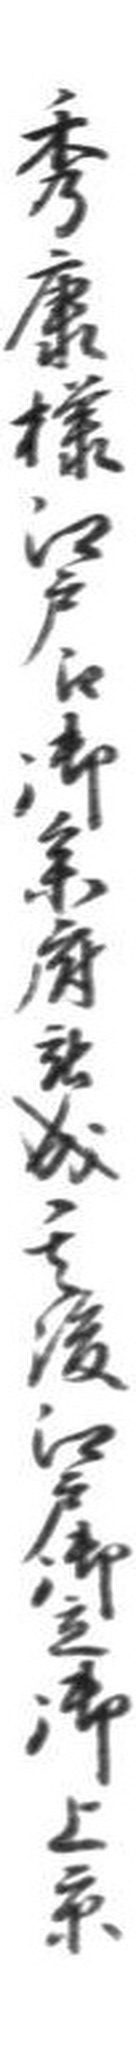秀康様江戸江御参府被成其後江戸御立御上京
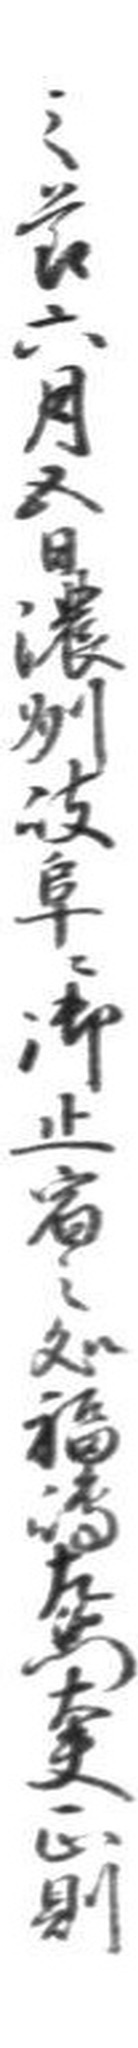之節六月五日濃州岐阜ニ御止宿之処福島左衛門大夫正則
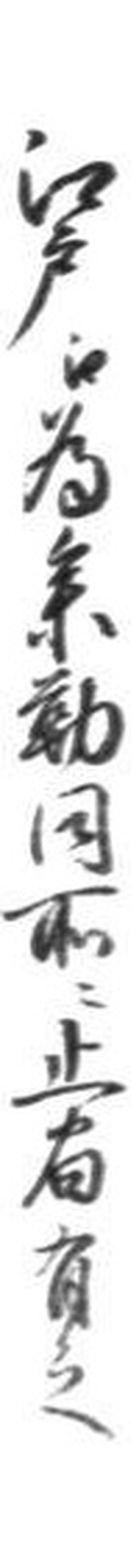江戸江為参勤同所ニ止宿有之

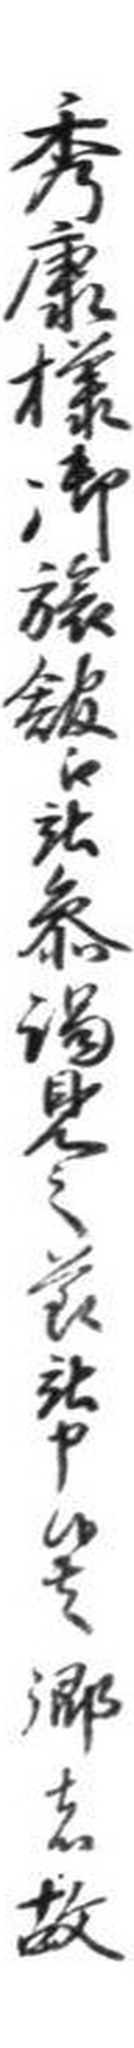秀康様御旅館江被参謁見之節被申候者卿者故
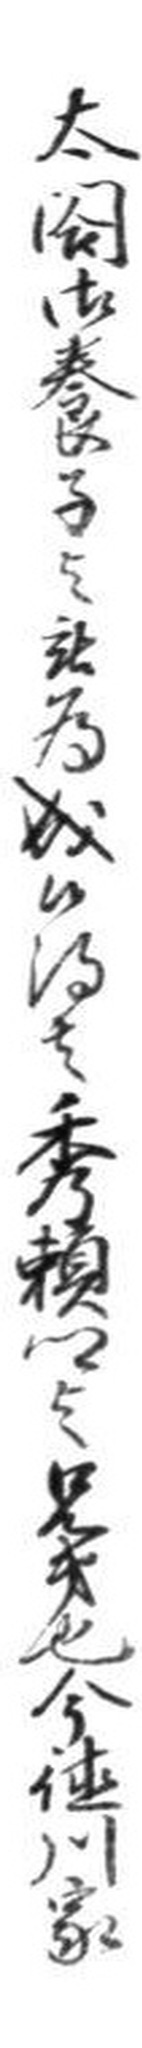太閤御養子と被為成候得者秀頼卿と兄弟也今徳川家
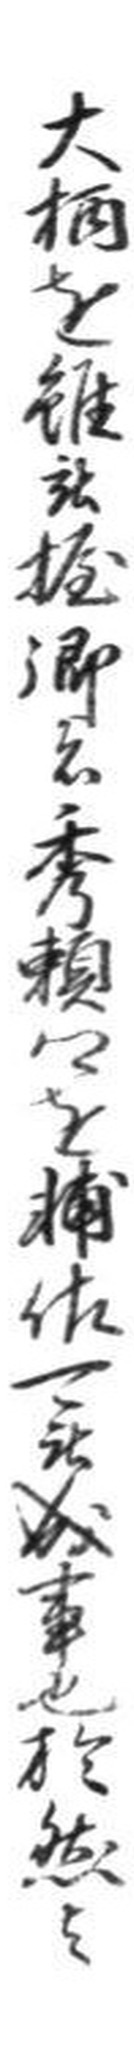大柄を雖被握卿者秀頼卿を補佐可被成事也於然者
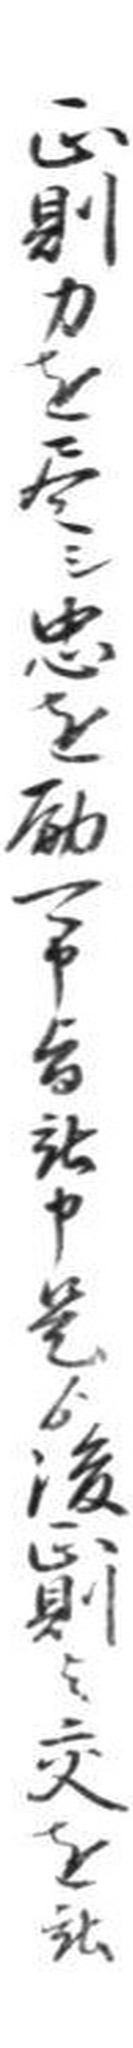正則力を尽シ忠を励可申旨被申是ゟ後正則と交を被
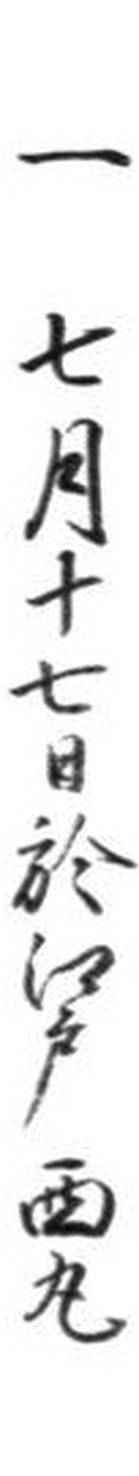一七月十七日於江戸西丸
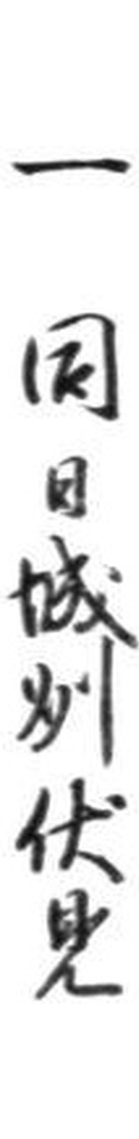一同日城州伏見
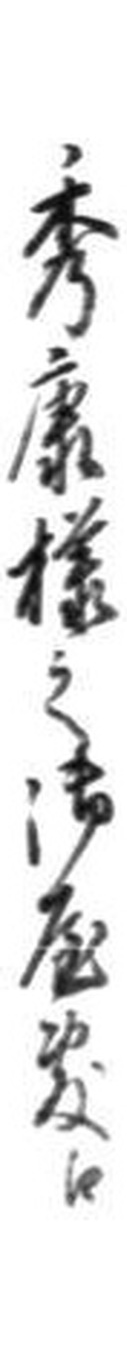秀康様之御屋敷江
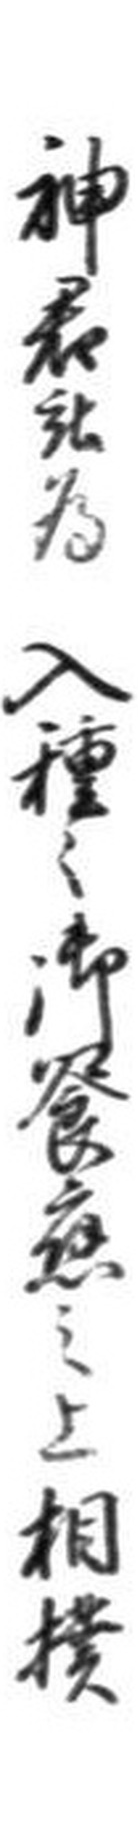神君被為入種々御饗応之上相撲
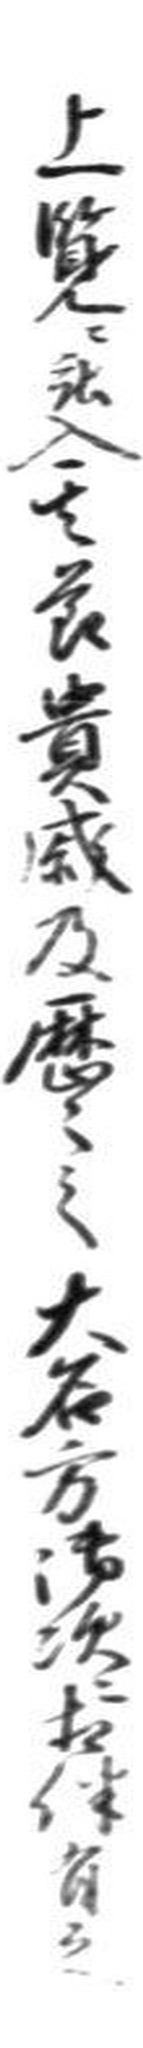上覧ニ被入其節貴戚及歴々之大名方御次ニ相伴有之
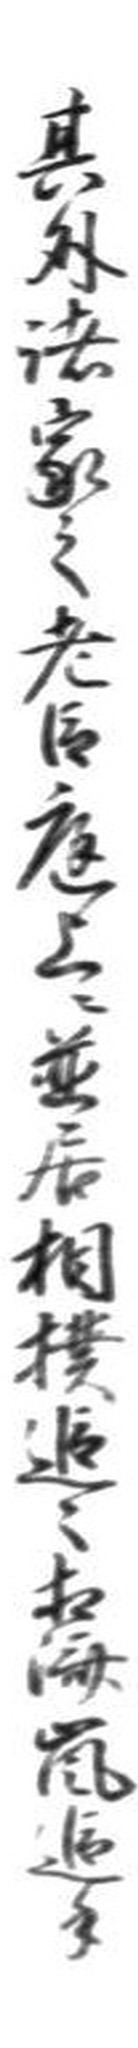其外諸家之老臣庭上ニ並居相撲追々相済嵐追手
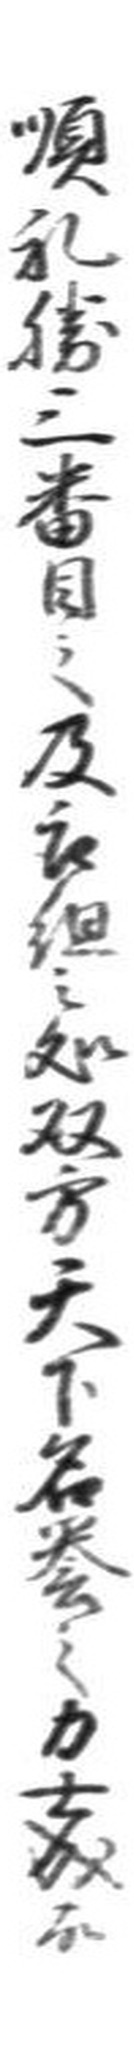巡礼勝三番目之及取組之処双方天下名誉之力士成故
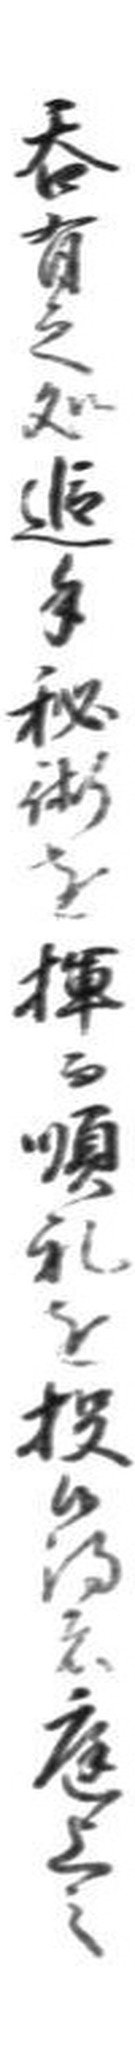呑有之処追手秘術を揮而順礼を投候得者庭上之
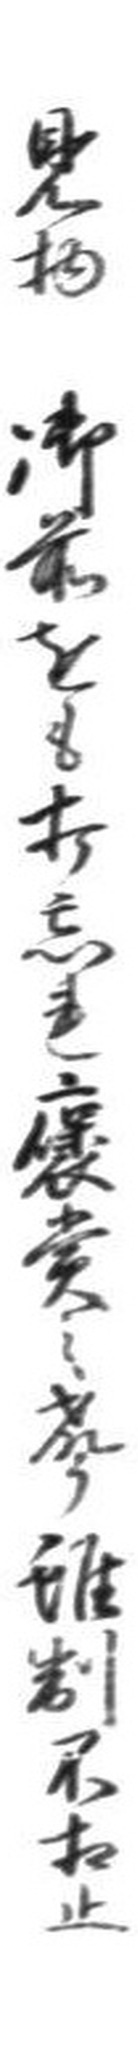見物御前をも打忘れ褒賞之声雖制不相止
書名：家譜 一 秀康公 従天正二年到慶長十二年
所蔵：福井県文書館 Fukui Prefectural Archives
